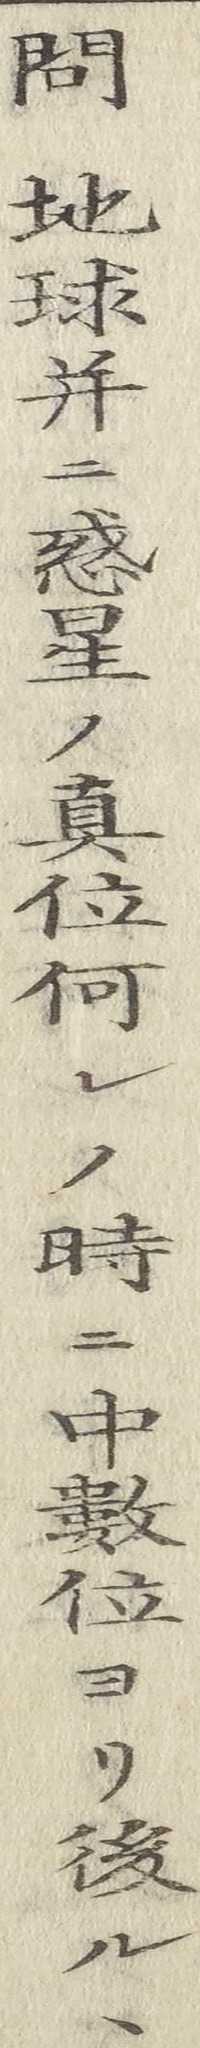問地球幷ニ惑星ノ真位何レノ時ニ中数位ヨリ後ルヽ

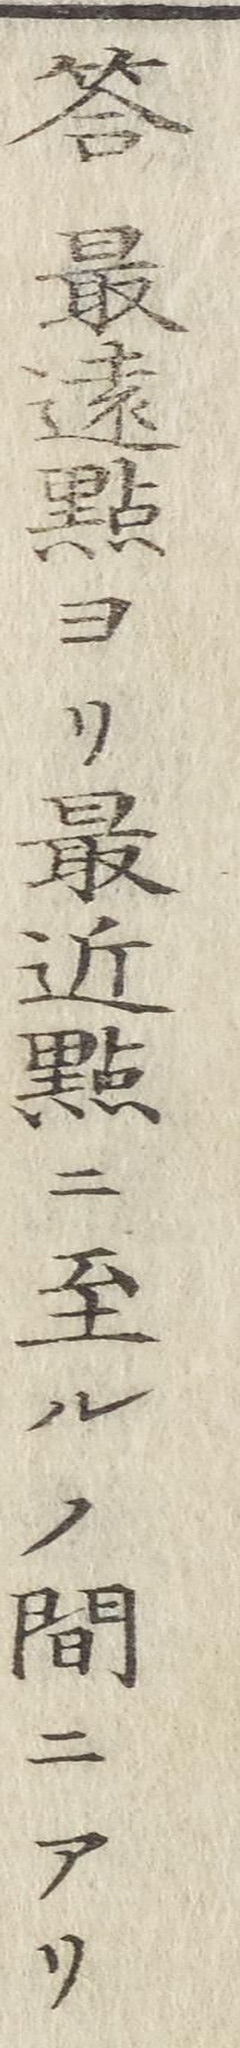答最遠点ヨリ最近点ニ至ルノ間ニアリ
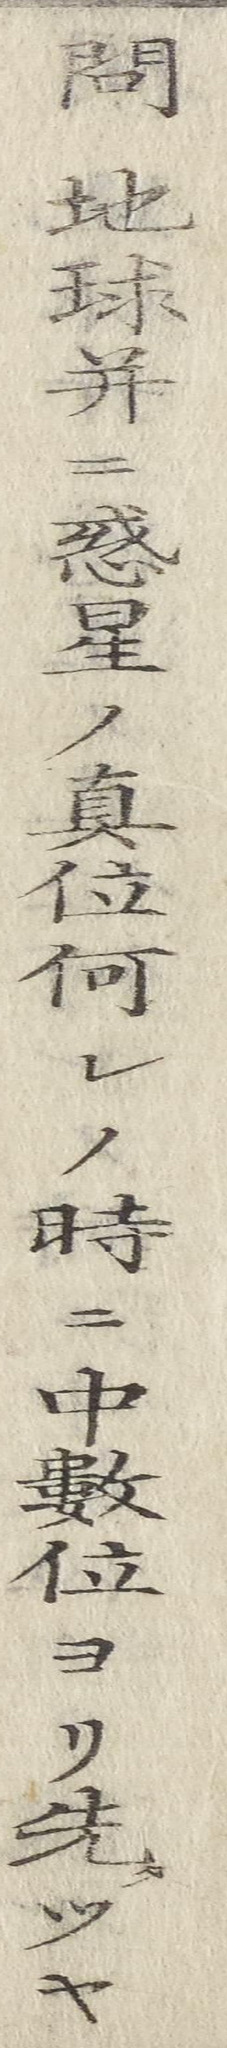問地球幷ニ惑星ノ真位何レノ時ニ中数位ヨリ先ツヤ
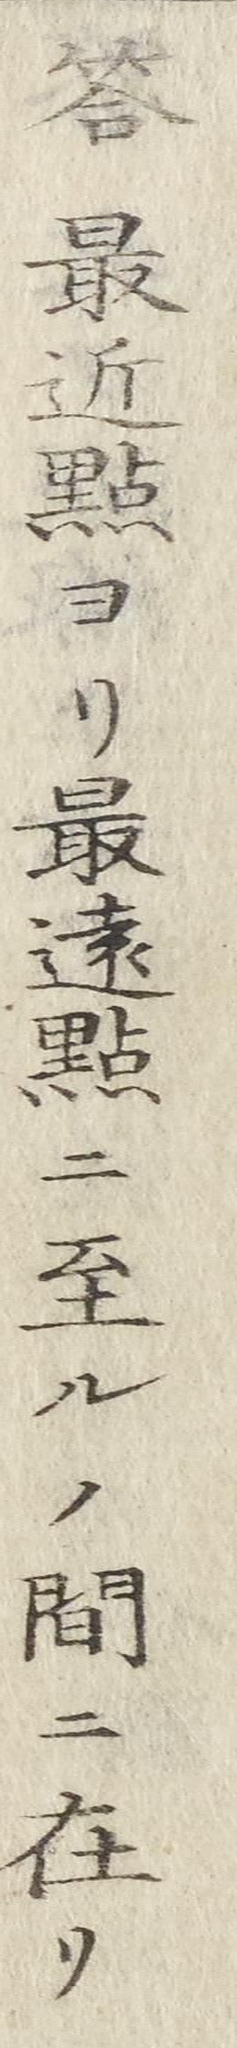答最近点ヨリ最遠点ニ至ルノ間ニ在リ
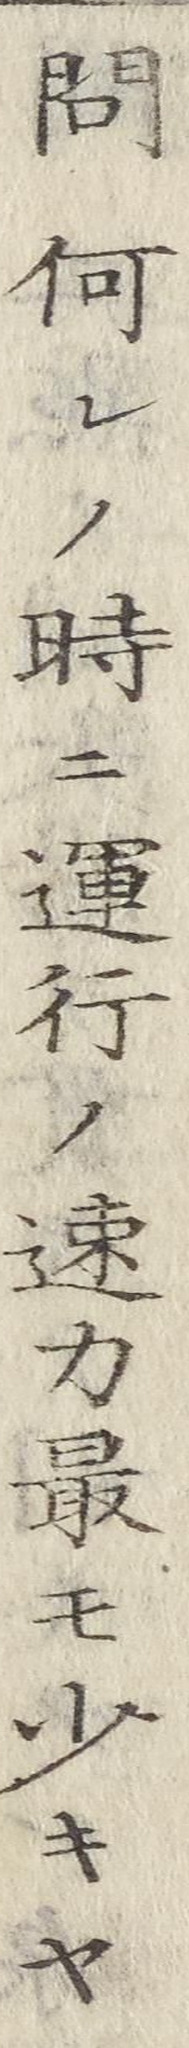問何レノ時ニ運行ノ速力最モ少キヤ
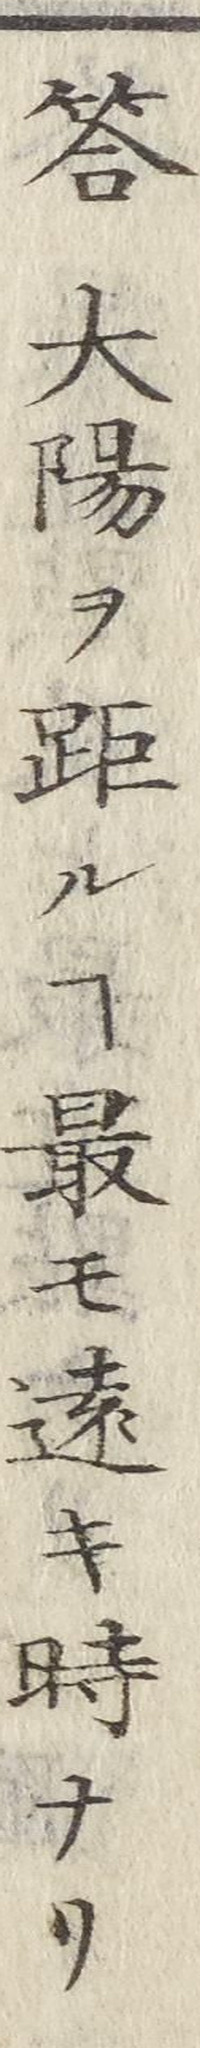答大陽ヲ距ルコト最モ遠キ時ナリ
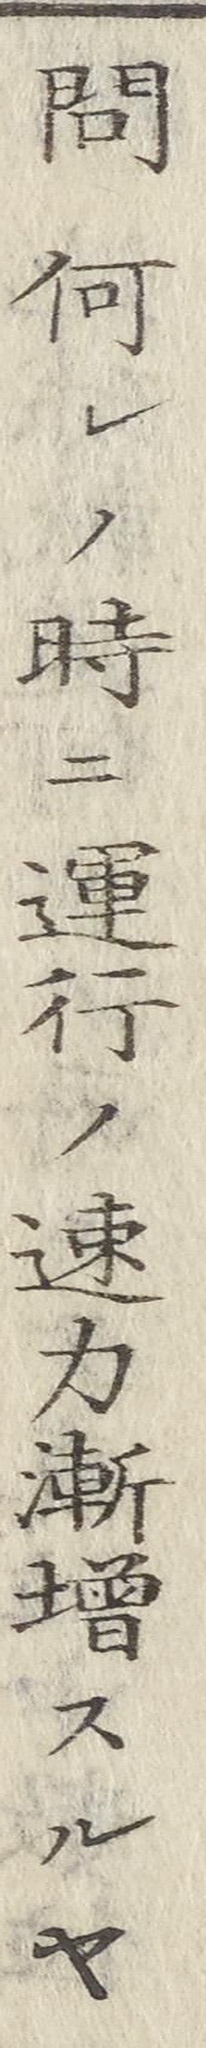問何レノ時ニ運行ノ速力漸増スルヤ
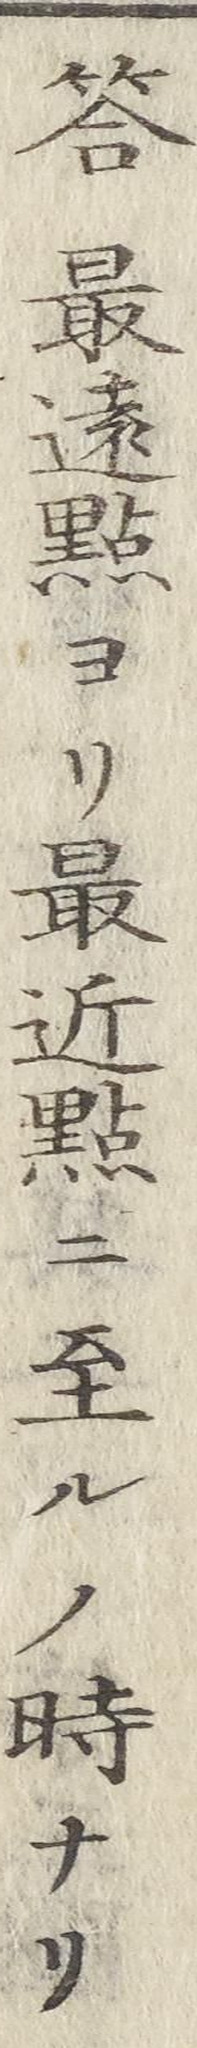答最遠点ヨリ最近点ニ至ルノ時ナリ
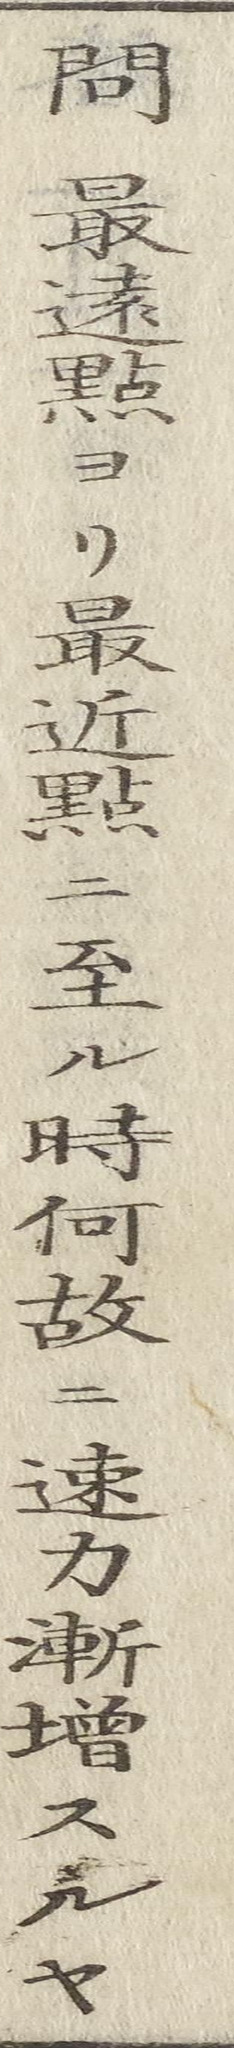問最遠点ヨリ最近点ニ至ル時何故ニ速力漸増スルヤ
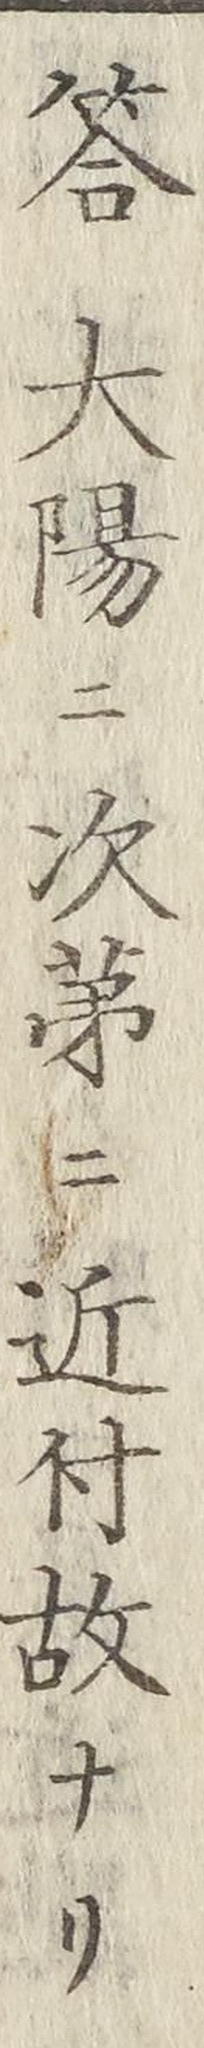答大陽ニ次第ニ近付故ナリ
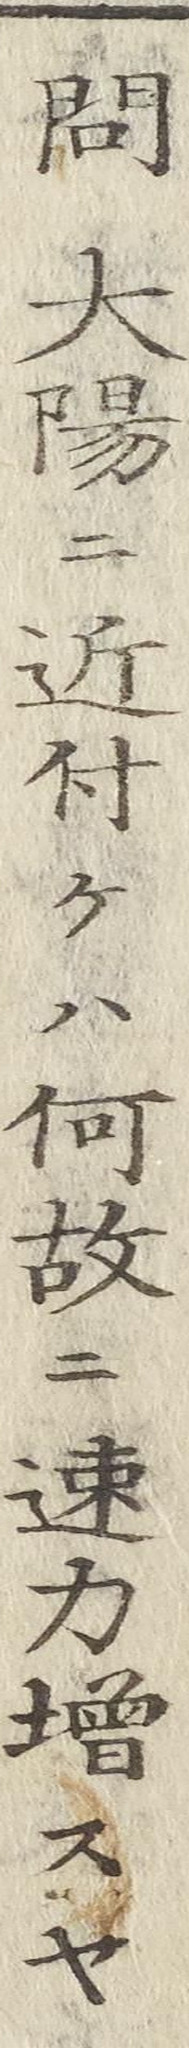問大陽ニ近付ケハ何故ニ速力増スヤ
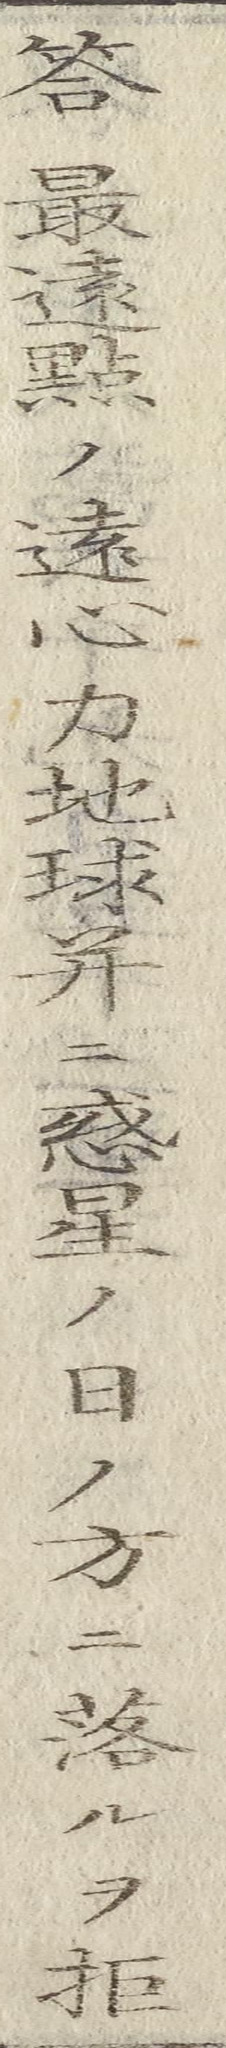答最遠点ノ遠心力地球幷ニ惑星ノ日ノ方ニ落ルヲ拒
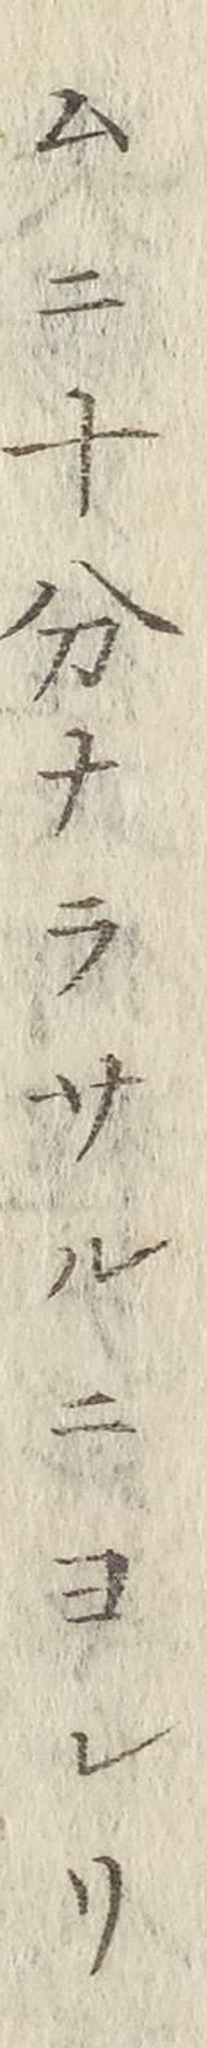ムニ十分ナラサルニヨレリ
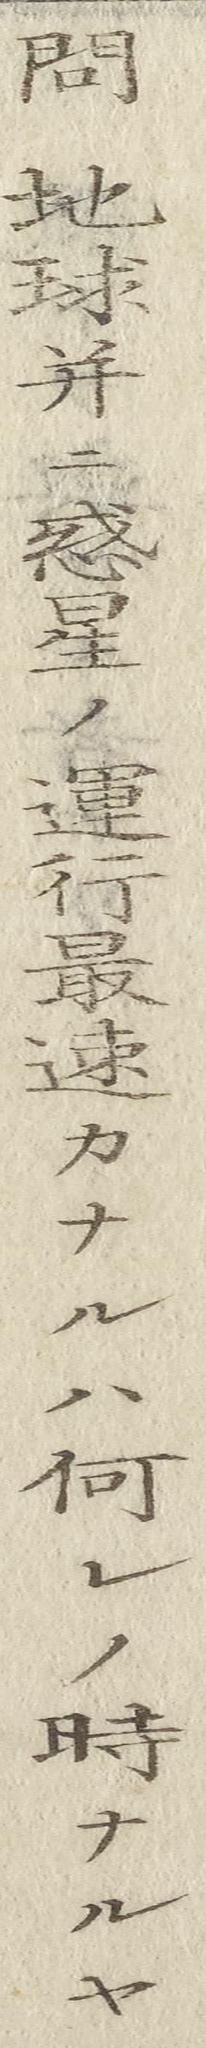問地球幷ニ惑星ノ運行最速カナルハ何レノ時ナルヤ
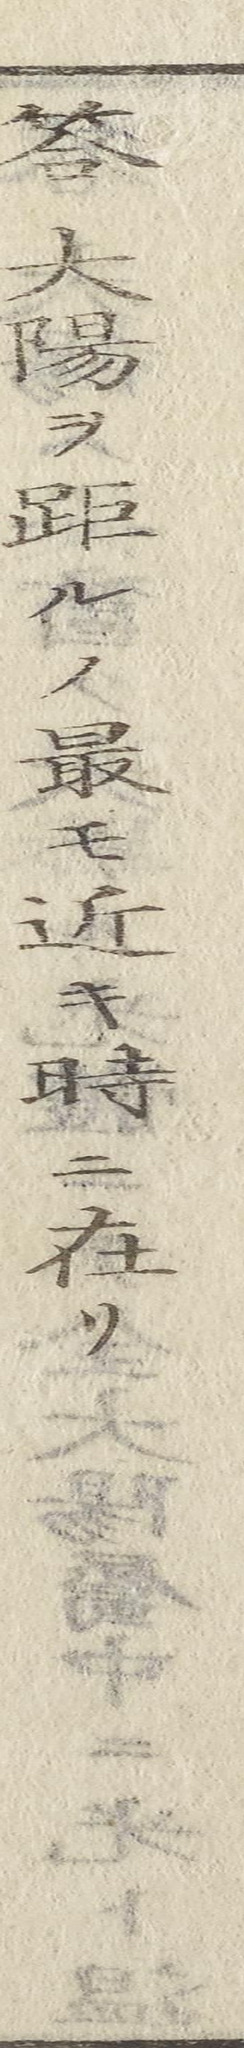答大陽ヲ距ルノ最モ近キ時ニ在リ
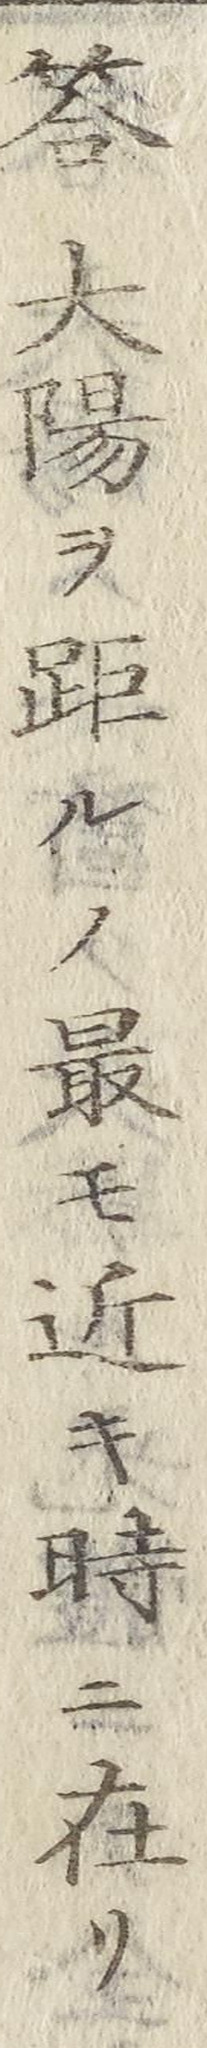答大陽ヲ距ルノ最モ近キ時ニ在リ
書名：星学圖説　上
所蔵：東京大学地震研究所図書室 Earthquake Research Institute Library, The University of Tokyo, JAPAN
